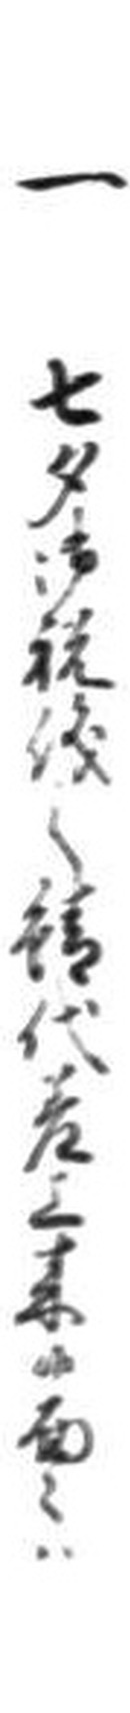一七夕御祝儀之鯖代差上来候面々ハ
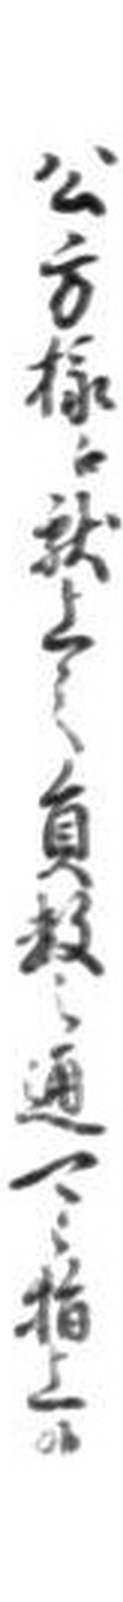公方様江献上之員数之通可被指上候
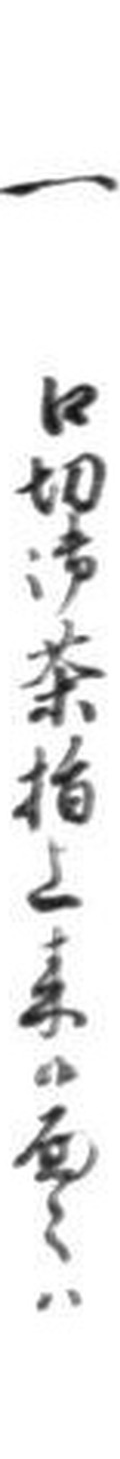一口切御茶指上来候面々ハ
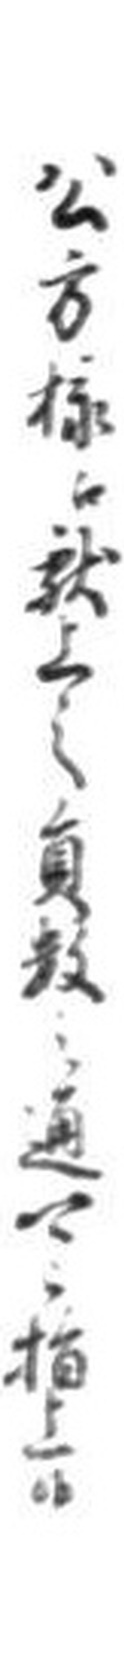公方様江献上之員数之通可被指上候
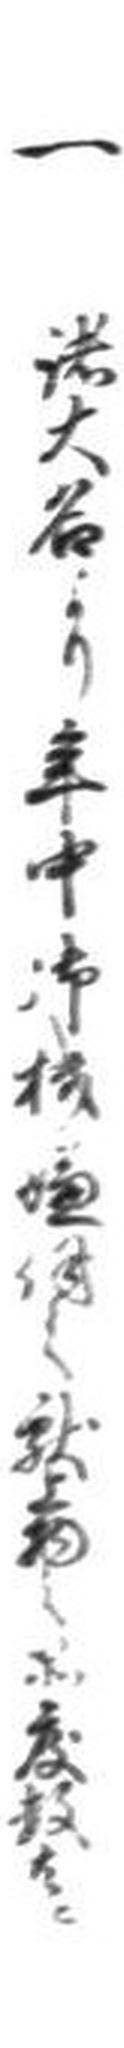一諸大名より年中御機嫌伺之献上物之品度数共ニ

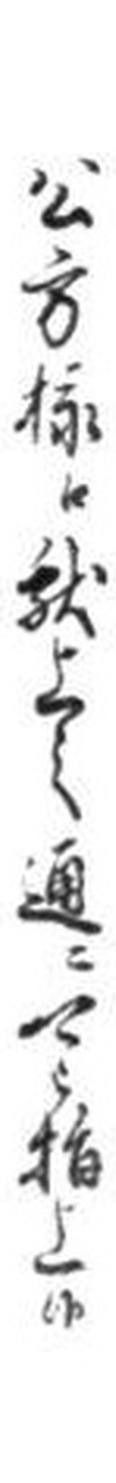公方様江献上通ニ可被指上候
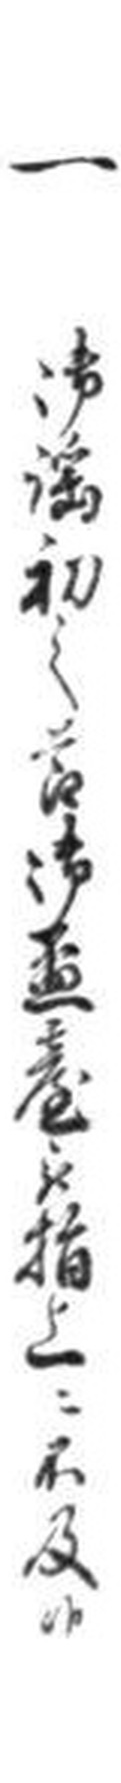一御謡初之節御盃台被指上ニ不及候
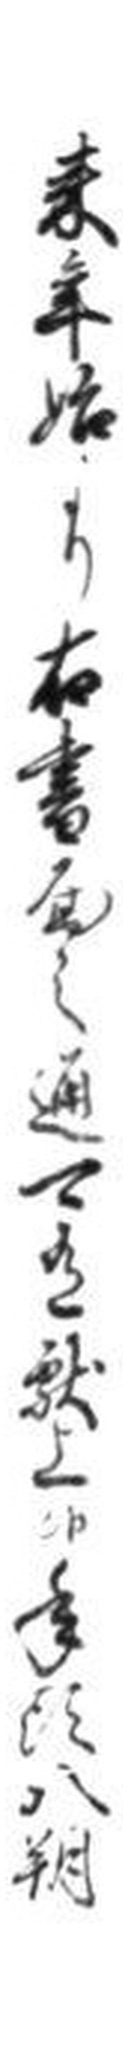来年始より右書面之通可有献上候年頭八朔
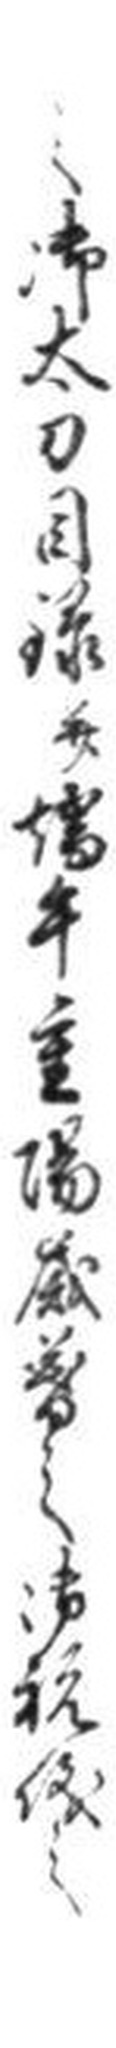之御太刀目録并端午重陽歳暮之御祝儀之
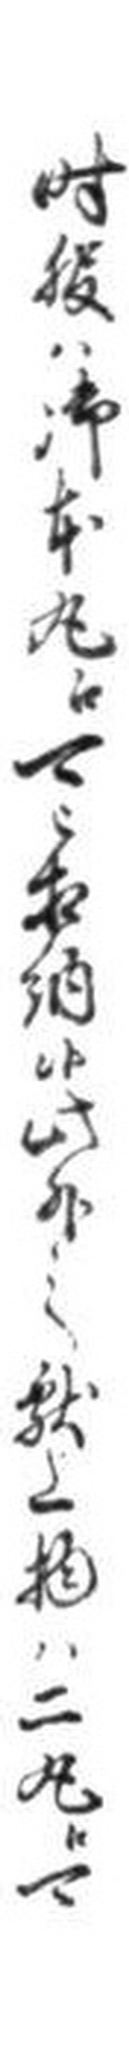時服ハ御本丸江可被相納候此外之献上物ハ二丸江可
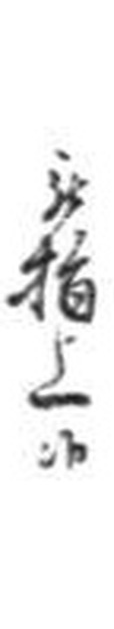被指上候
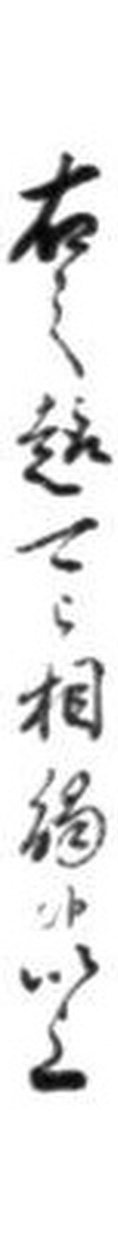右之趣可被相触候以上
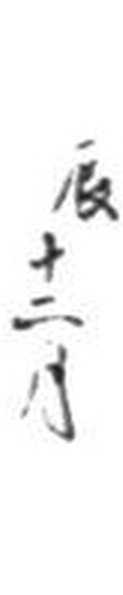辰十二月
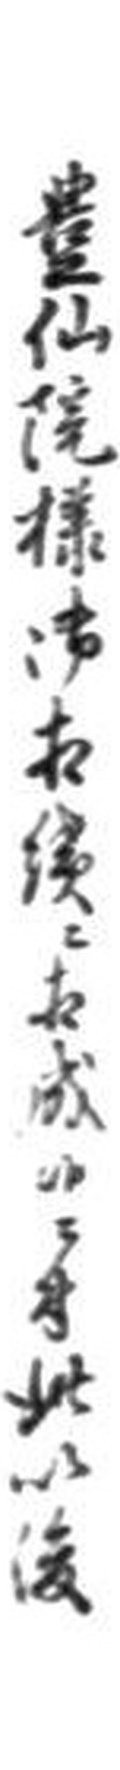豊仙院様御相続ニ相成候ニ付此以後
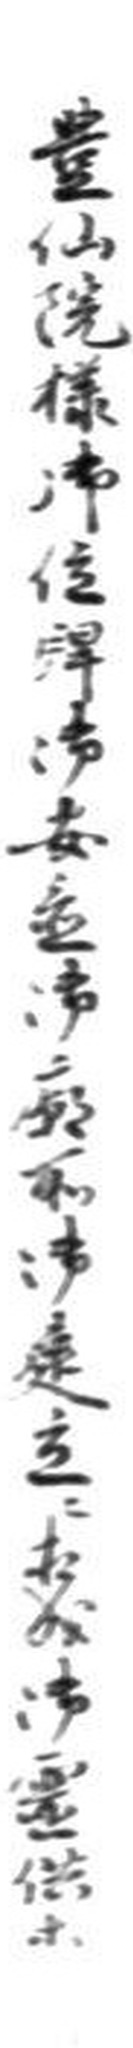豊仙院様御位牌御安置御廟所御建立ニ相成御霊供等
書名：家譜 三十八 宗矩公 従享保九年五月到享保九年十二月
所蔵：福井県文書館 Fukui Prefectural Archives
